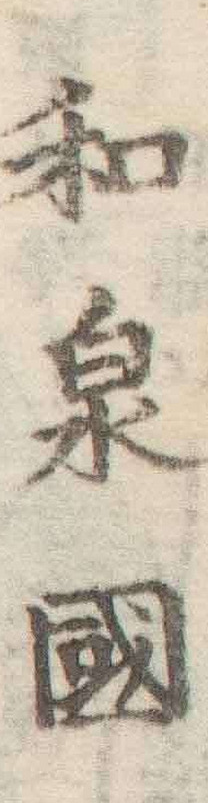和泉国

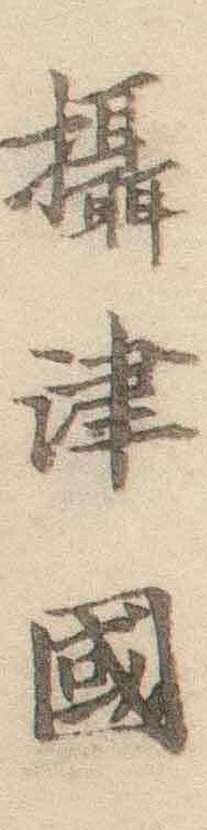摂津国

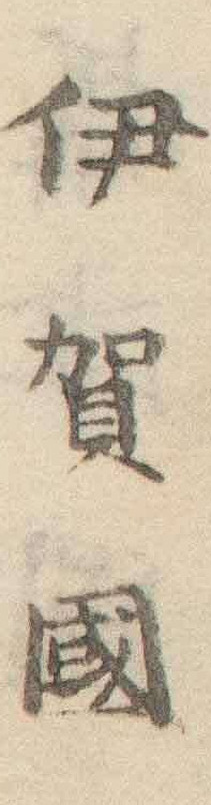伊賀国

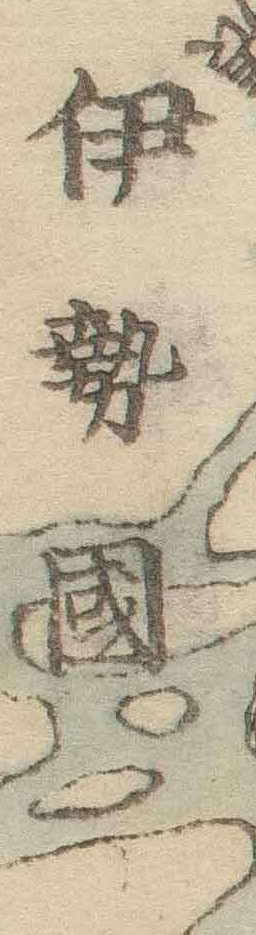伊勢国

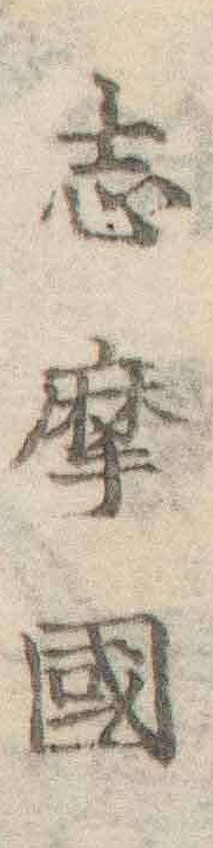志摩国

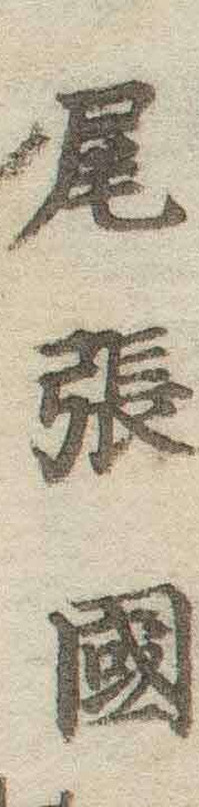尾張国

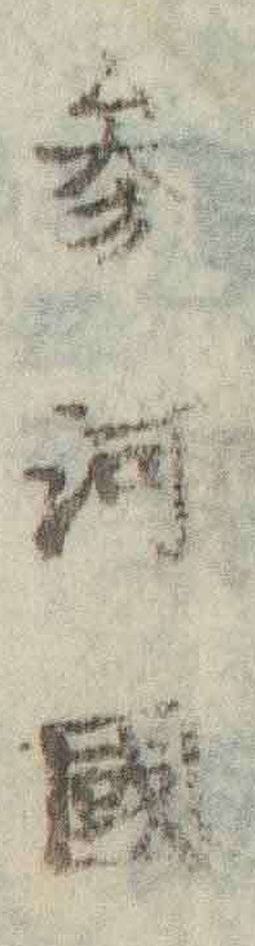参河国

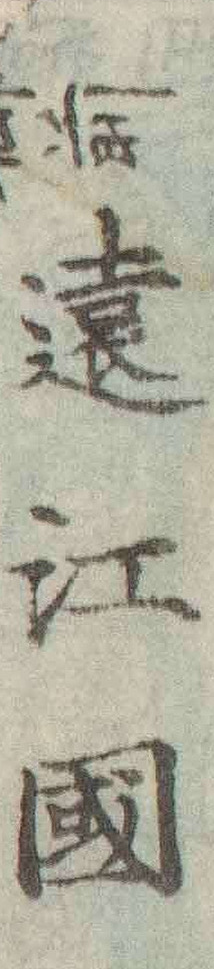遠江国
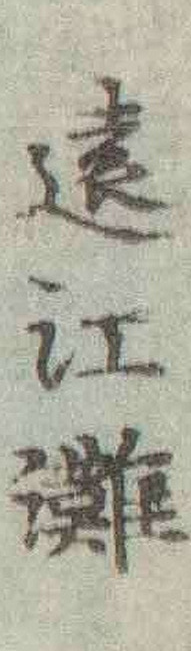遠江国

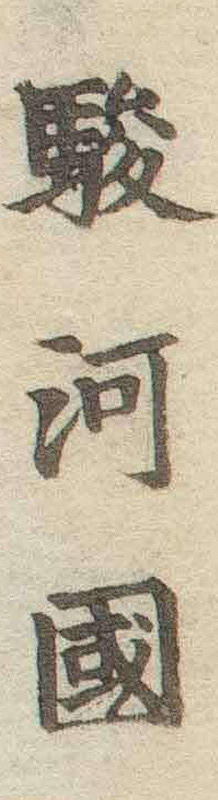駿河国

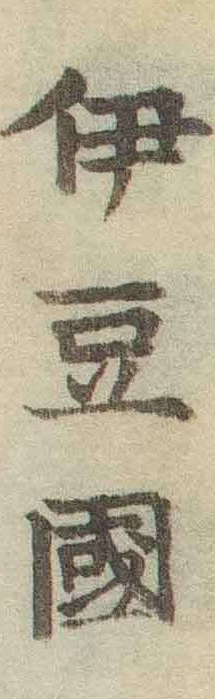伊豆国
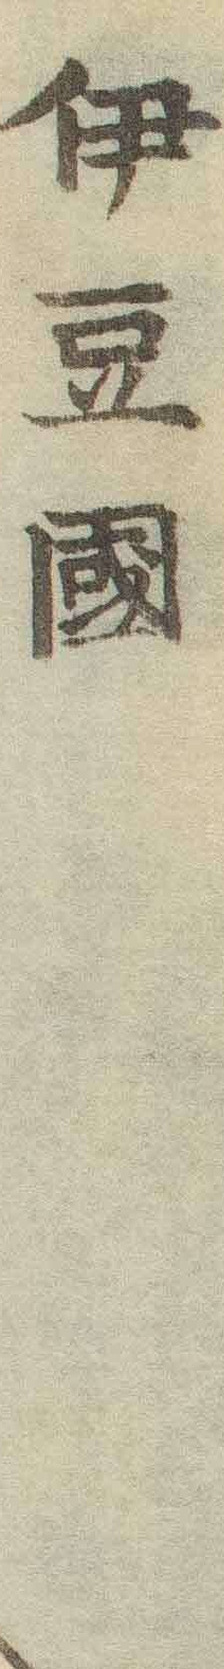伊豆国

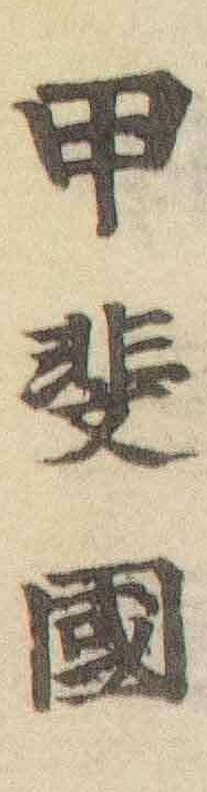甲斐国

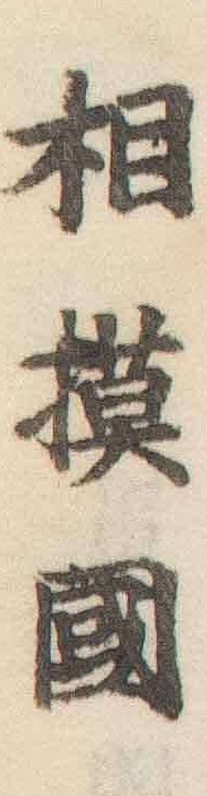相摸国

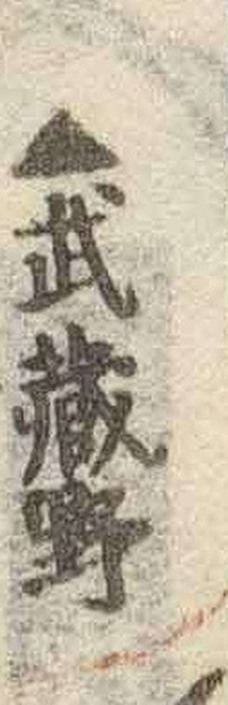武蔵国
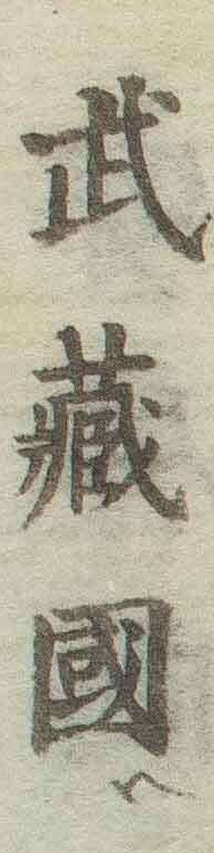武蔵国
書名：国郡全図
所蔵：東京学芸大学附属図書館 国文学研究資料館
